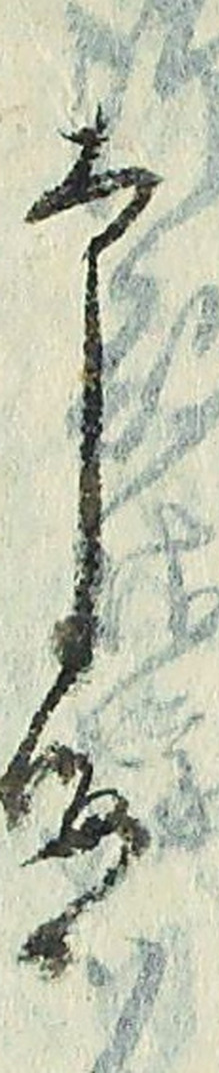十一月晦日
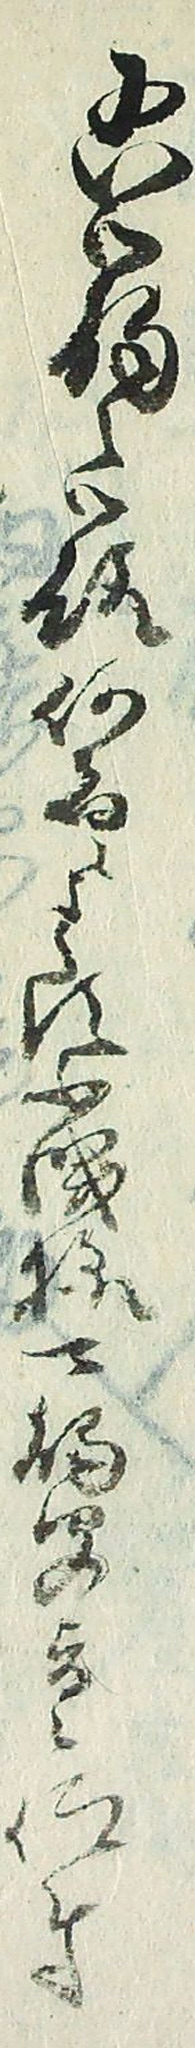右御触之御趣何者によらす不洩様可触聞旨被仰付
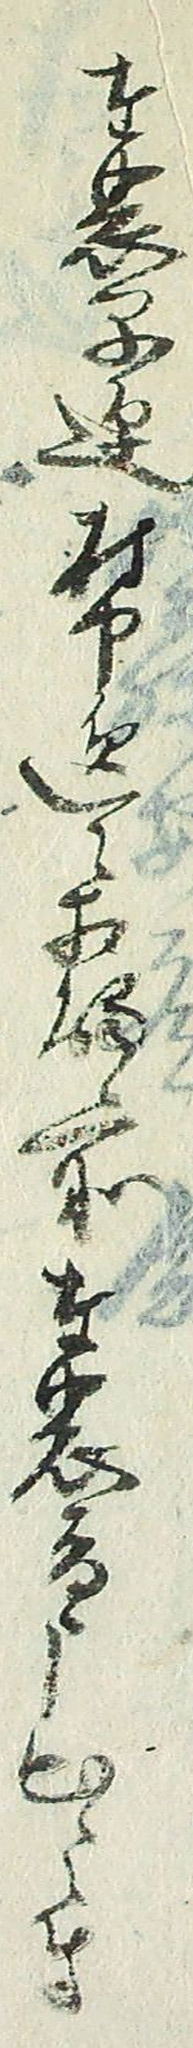奉畏早速村中逸々相触候所奉畏旨申出候に付
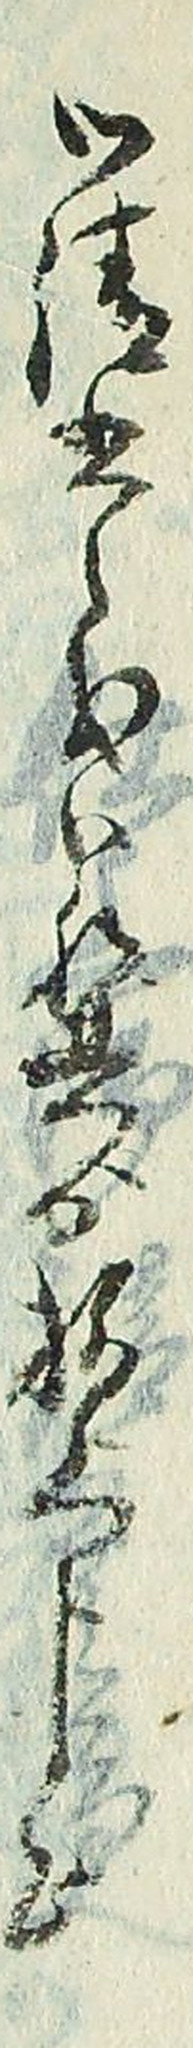御請書之義は私共ゟ指上申候以上
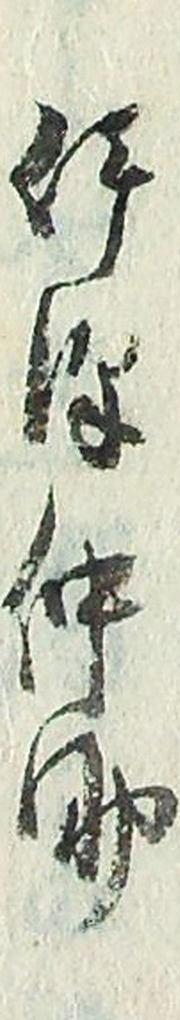伊澤仲助
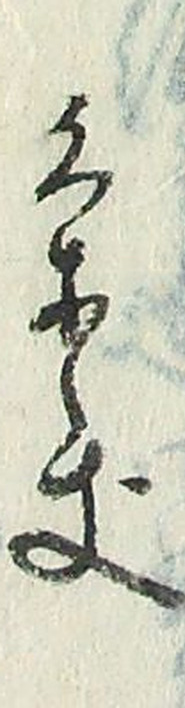久米之丈
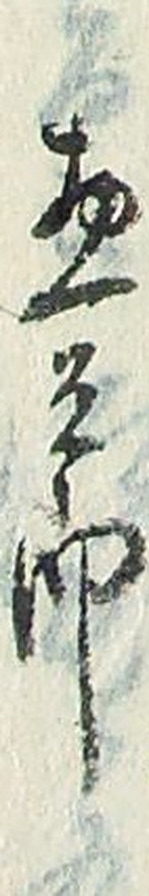惣太郎
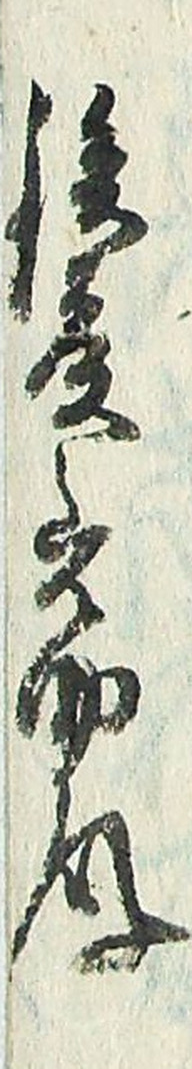後藤善助殿

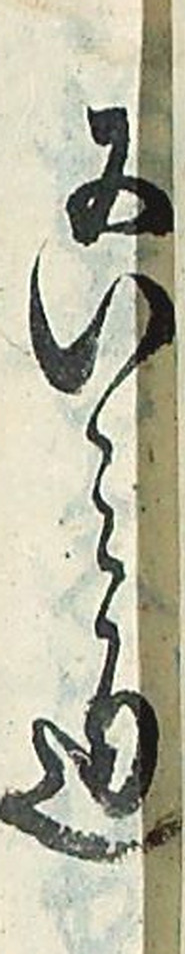右之通
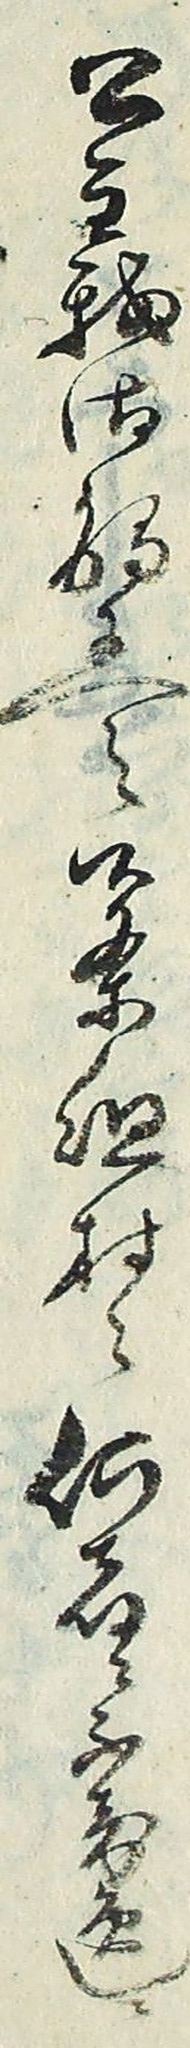公義御触有之候条組村々何者に不寄逸々
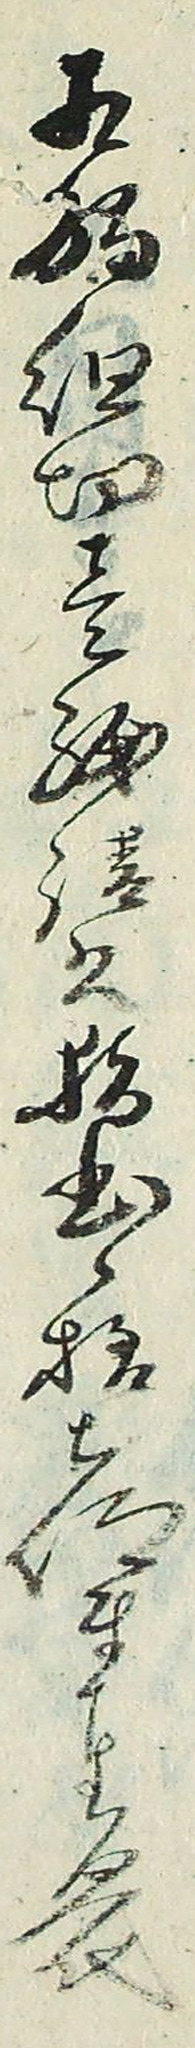相触組切壱紙請書指出候様被仰付奉畏
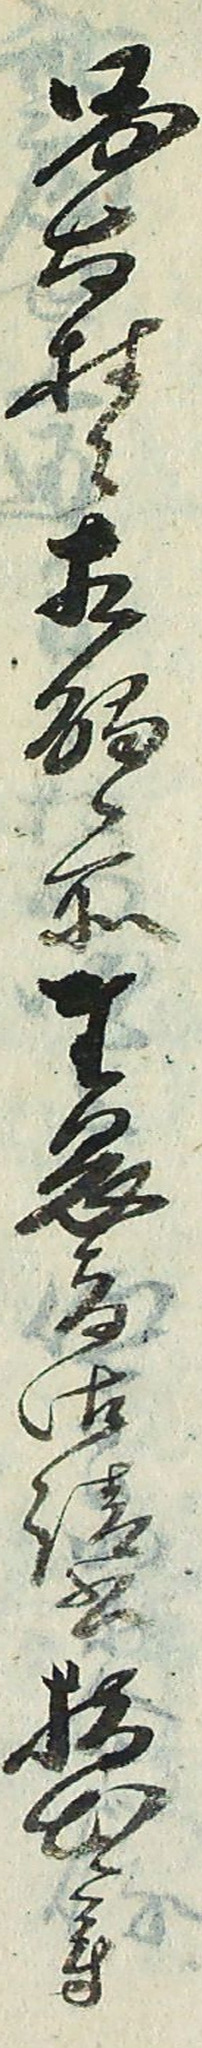則与村々相触候所奉畏旨御請書指出候に付
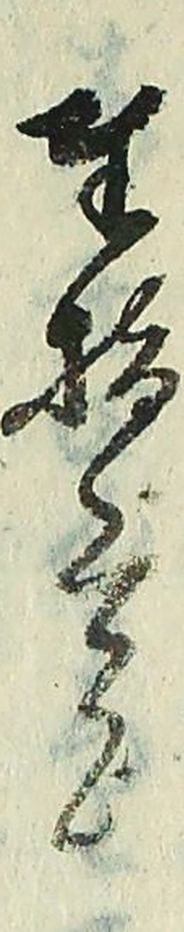奉指上候以上
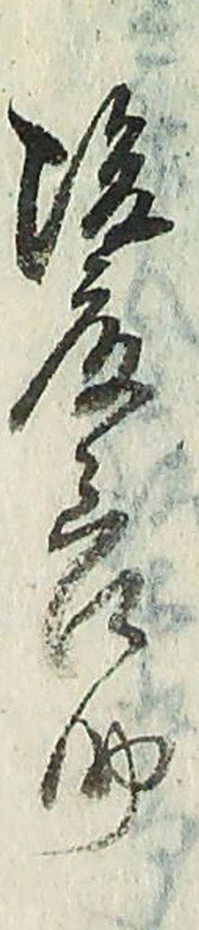後藤善助
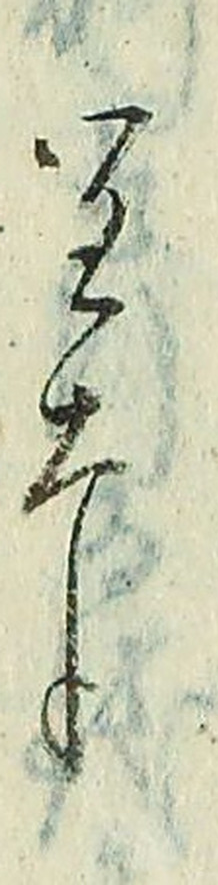閏十一月
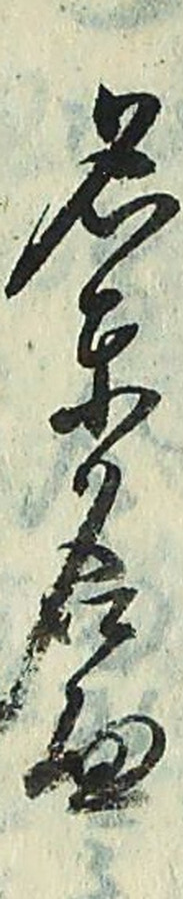名東名西
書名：諸御用御□受書控
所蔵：鳴門教育大学 Naruto University of Education
